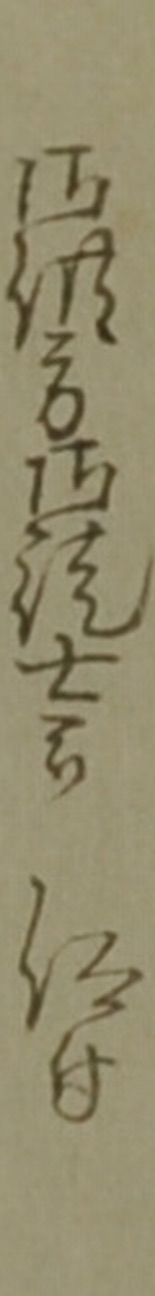御供方御徒士被仰付
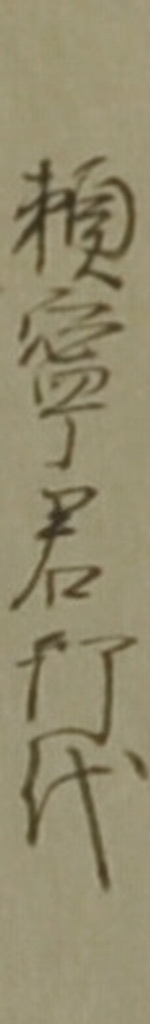頼寧君御代
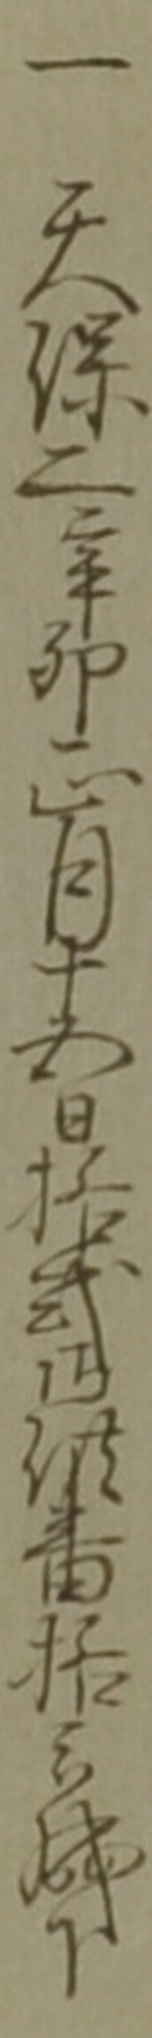一天保二辛卯正月十五日格式御供番格被成下
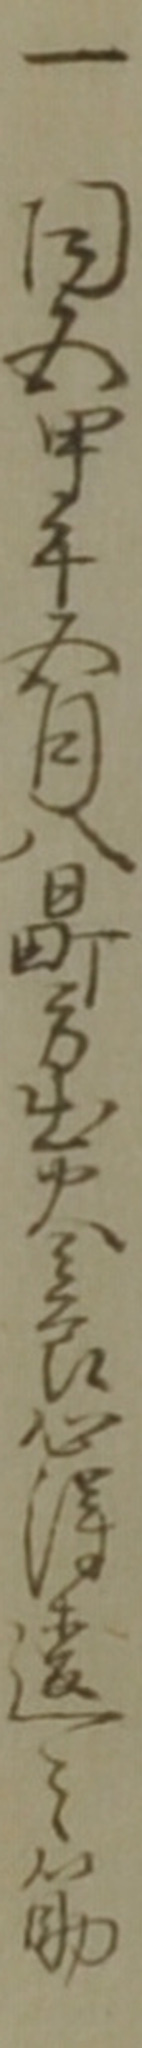一同五甲午五月八日町方出火之節心得違之筋
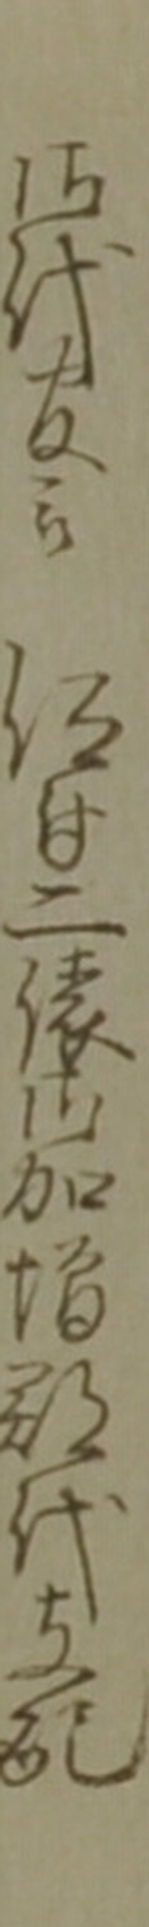御代官被仰付二俵御加増郡代支配
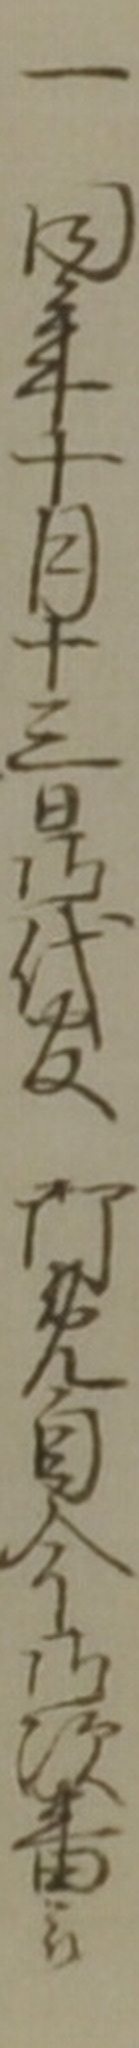一同年十月十三日御代官御免自今御次番被
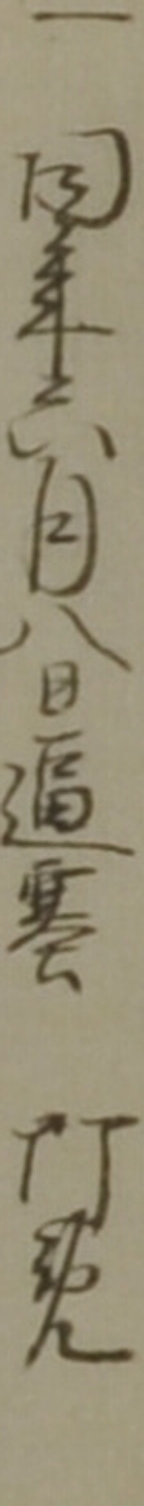一同年六月八日逼塞御免
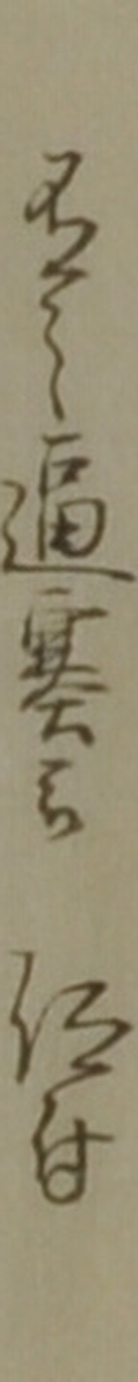有之逼塞被仰付
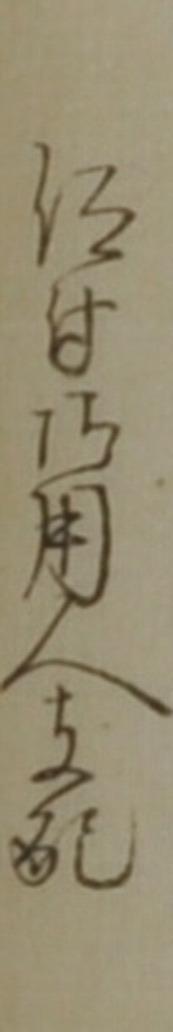被仰付御用人支配
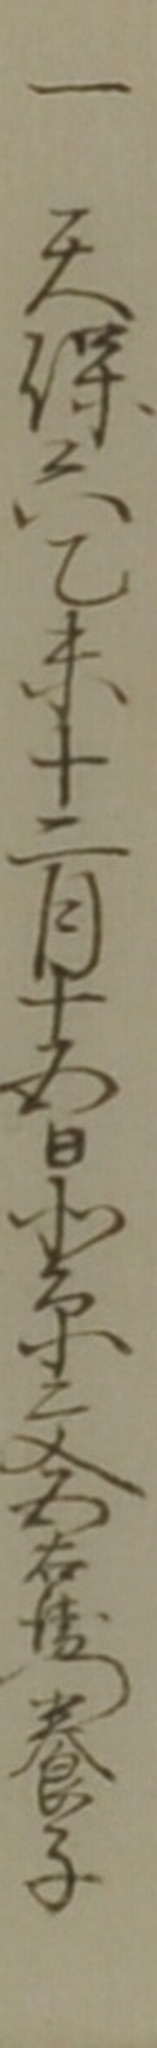一天保六乙未十二月十五日北原文五右衛門養子
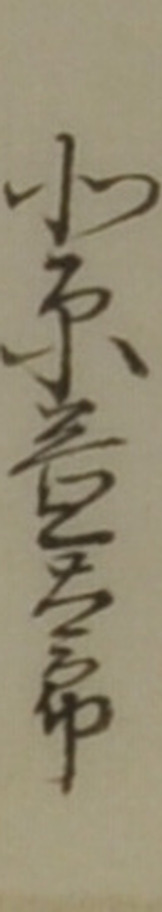北原益太郎
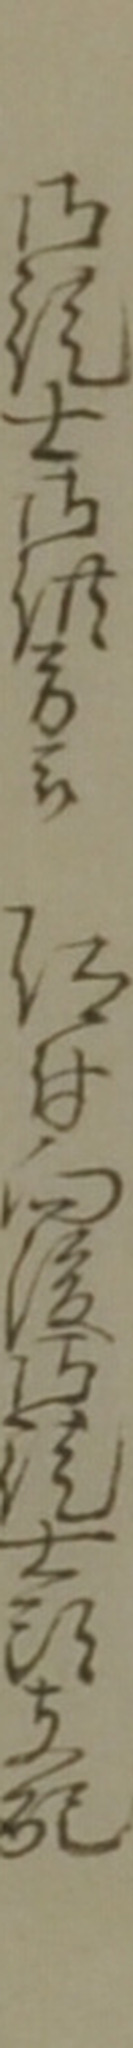御徒士御供方被仰付向後御徒士頭支配
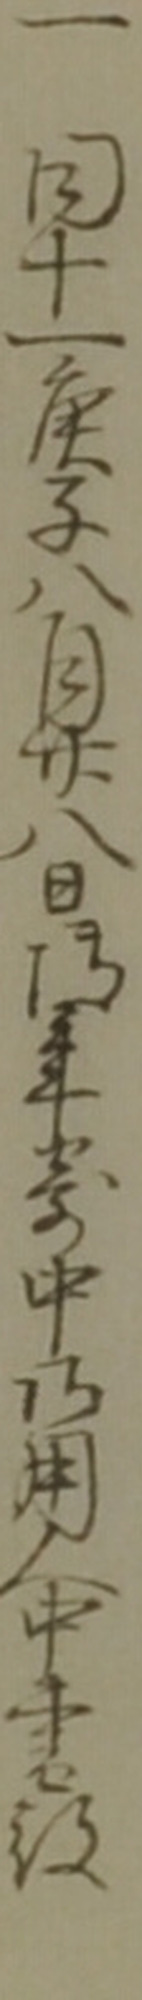一同十一庚子八月廿八日御年寄中御用人中書役
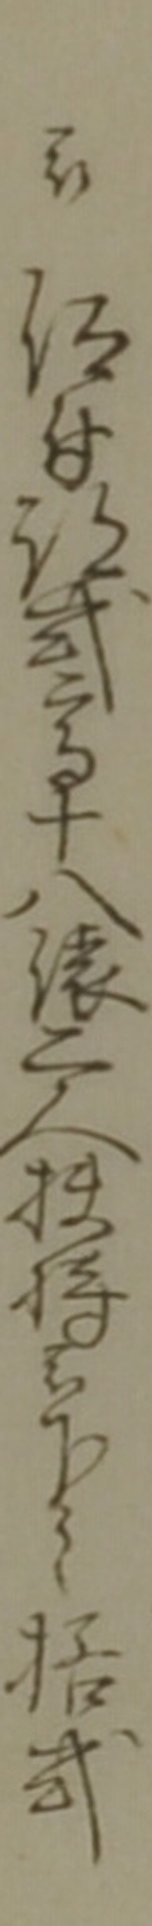被仰付跡式高十八俵二人扶持被下之格式
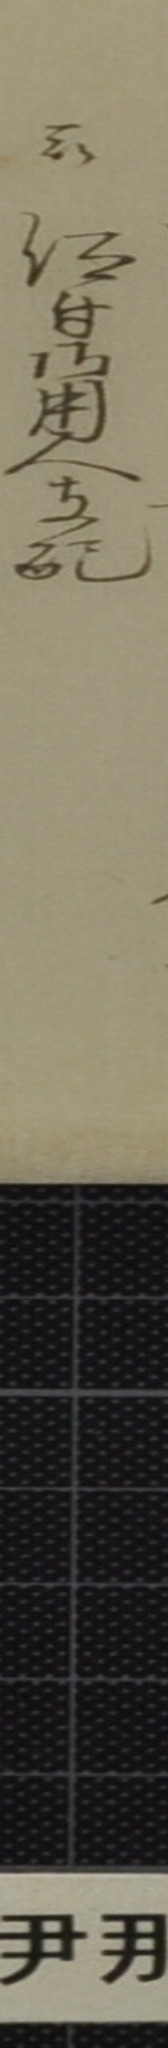被仰付御用人支配
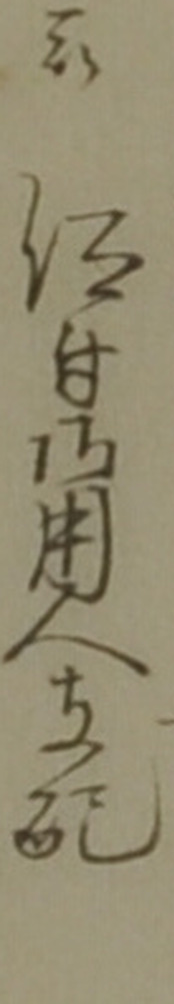被仰付御用人支配
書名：無足諸士勤仕録（六）
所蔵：伊那市立高遠町図書館・合同会社AMANE
